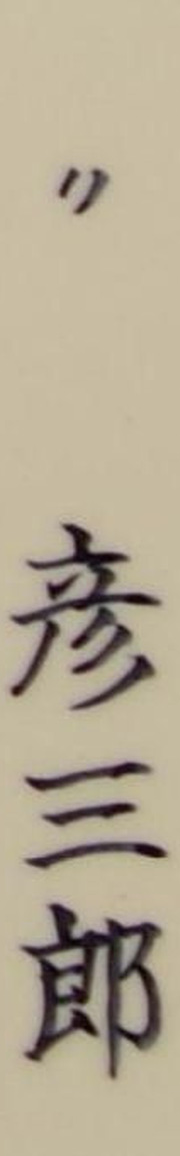彦三郎
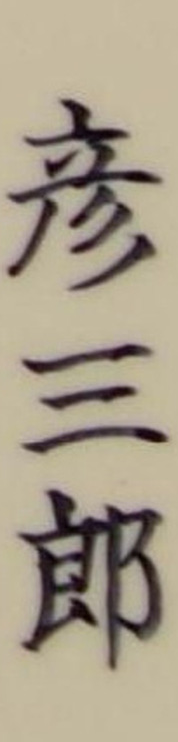彦三郎
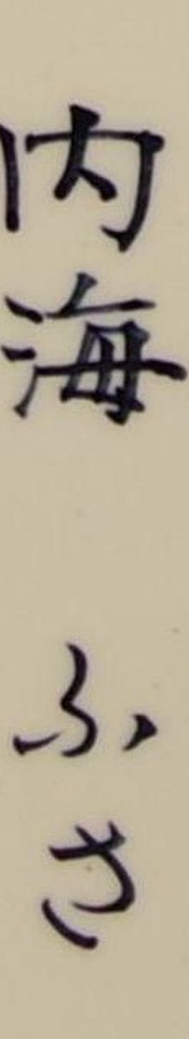内海ふさ
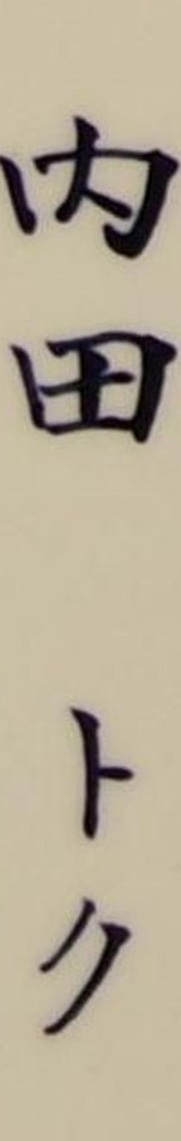内田トク
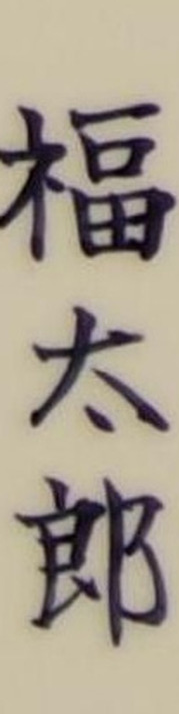福太郎
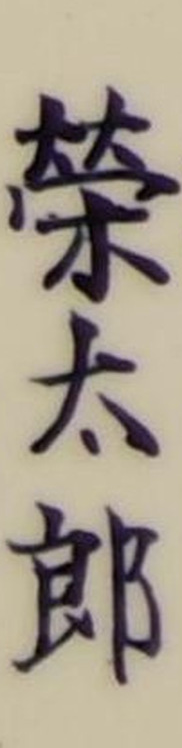榮太郎
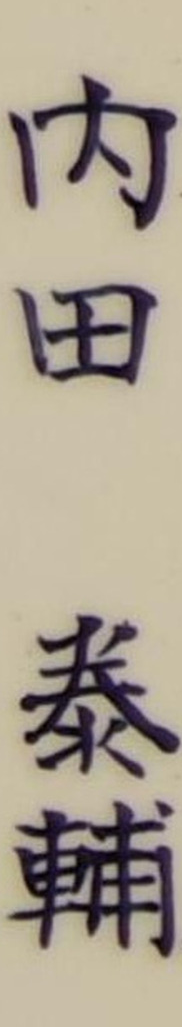内田泰輔
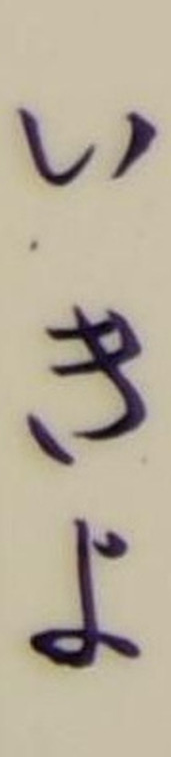いきよ

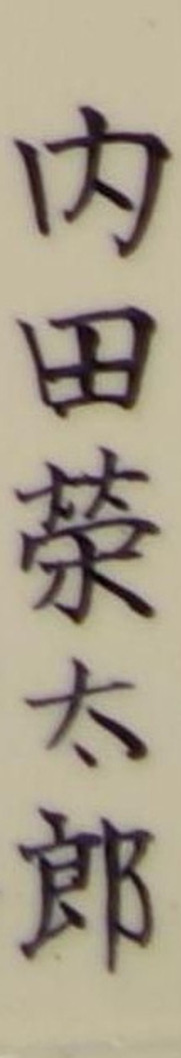内田栄太郎
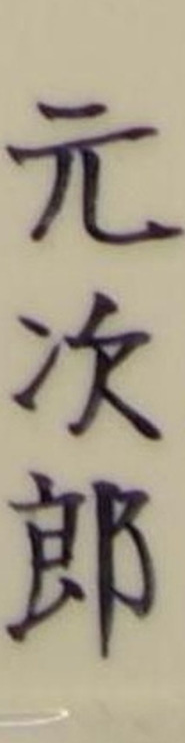元次郎
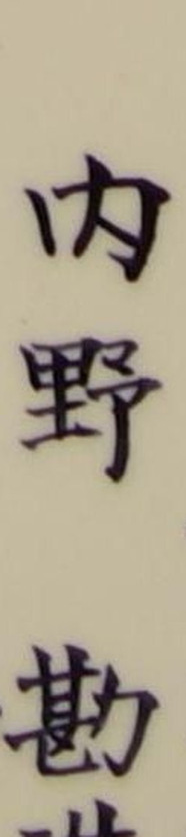内野勘造
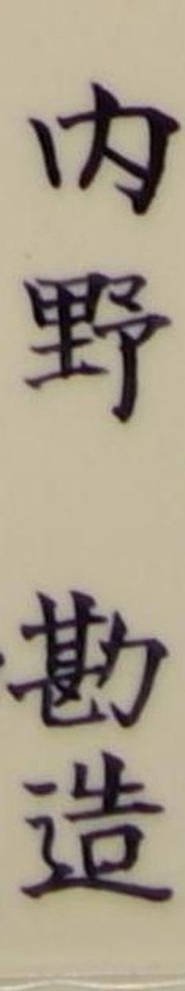内野勘造
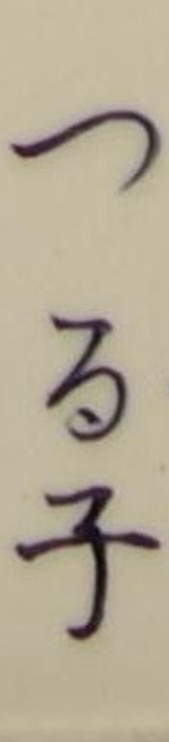つる子
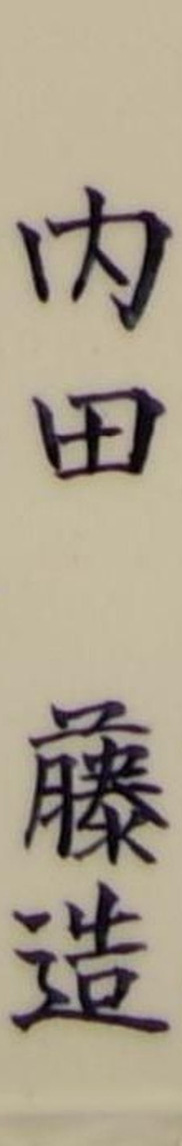内田藤造
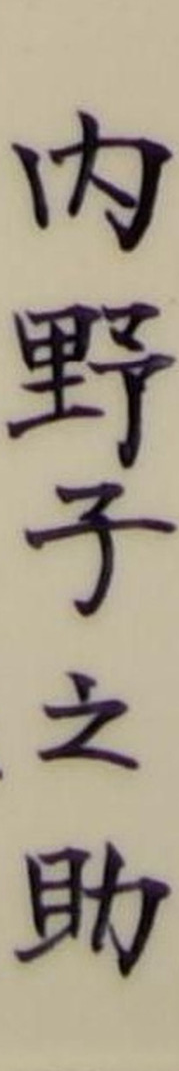内野子之助
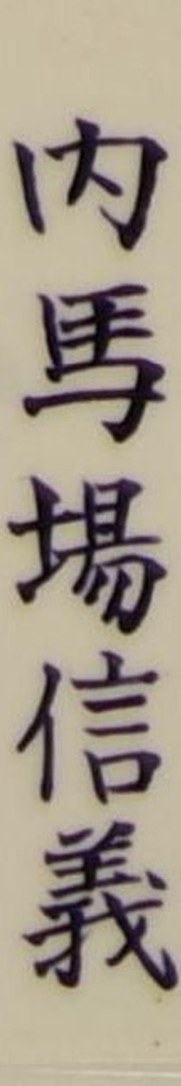内馬場信義
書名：A~D
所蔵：koyasan kongobuji
